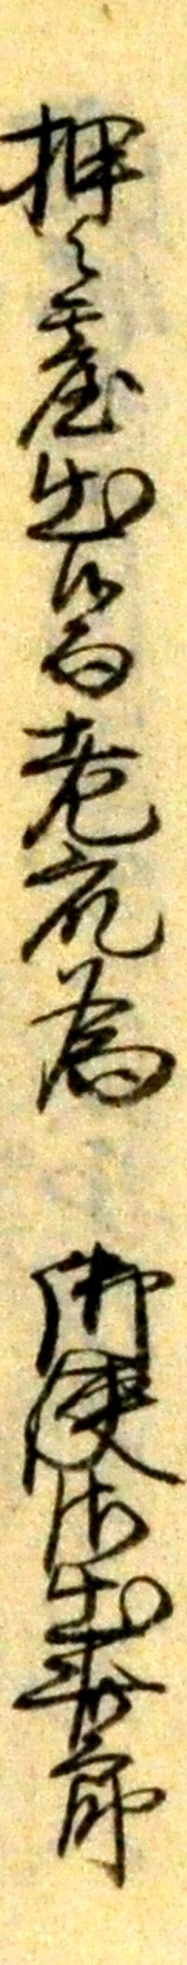押之台出候而老衆為御使御出此節
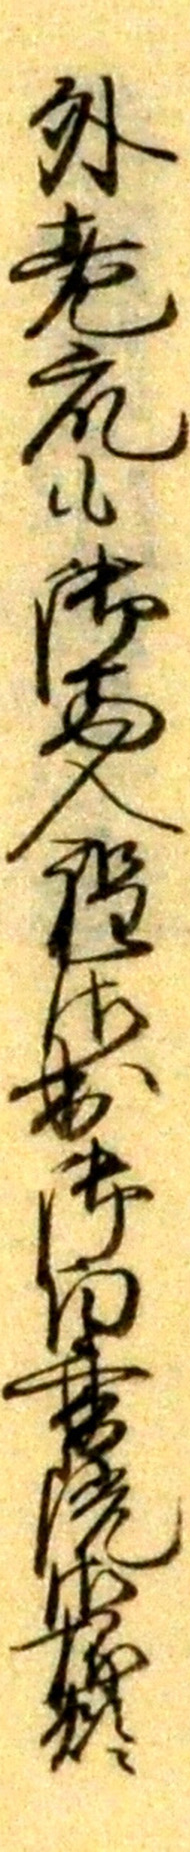外老衆も御両人程御出御白書院御縁頬ニ
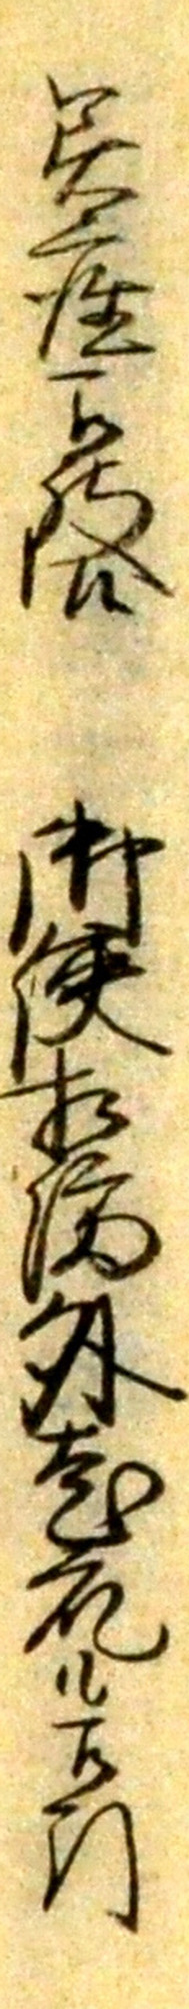着座被致候御使相済外老衆も被引
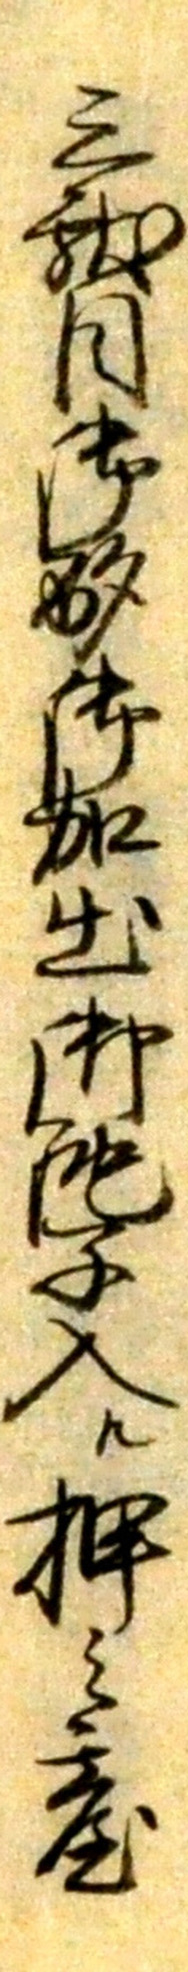三献目御酌御加出御銚子入ル押之台
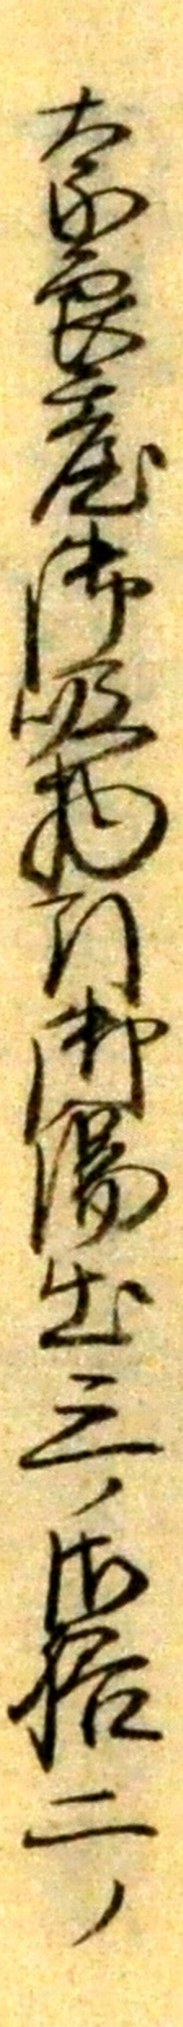奈良台御吸物引御湯出三ノ御膳二ノ
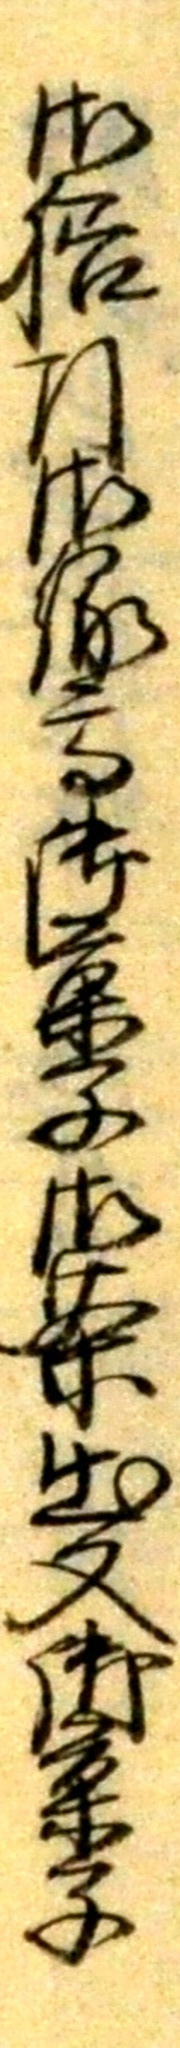御膳引御縁高御菓子御茶出又御菓子
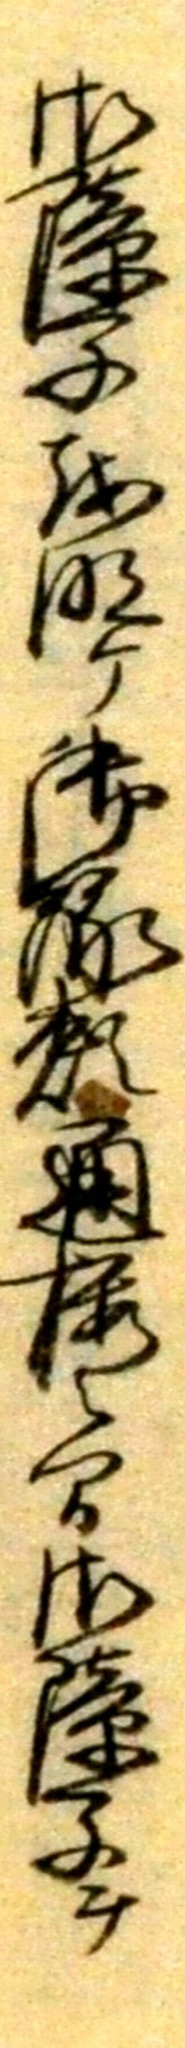御障子を明ケ御縁頬通桜之間御障子ヲ
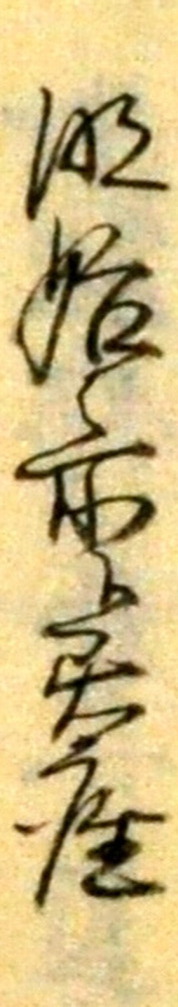明始之所え着座
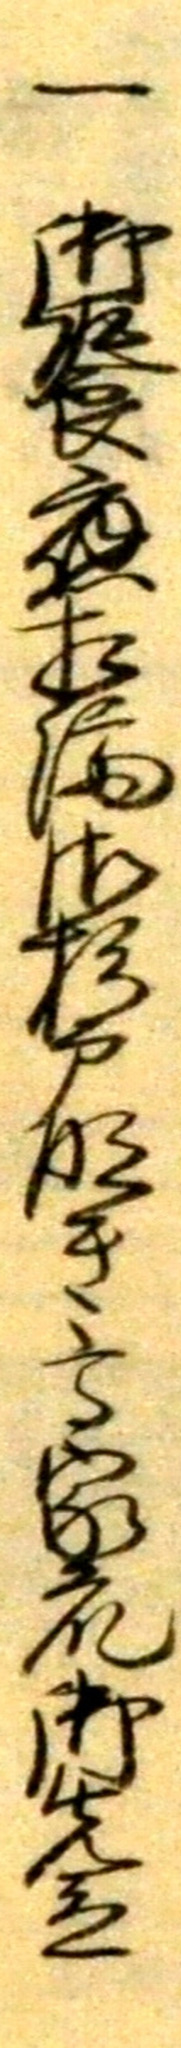一御饗応相済御杉戸明き高家衆御先立
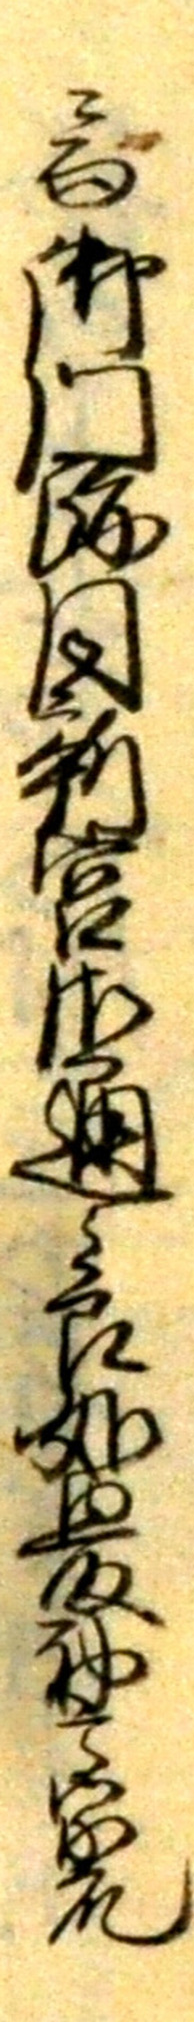ニ而御門跡同新官御通之節如最初高家衆

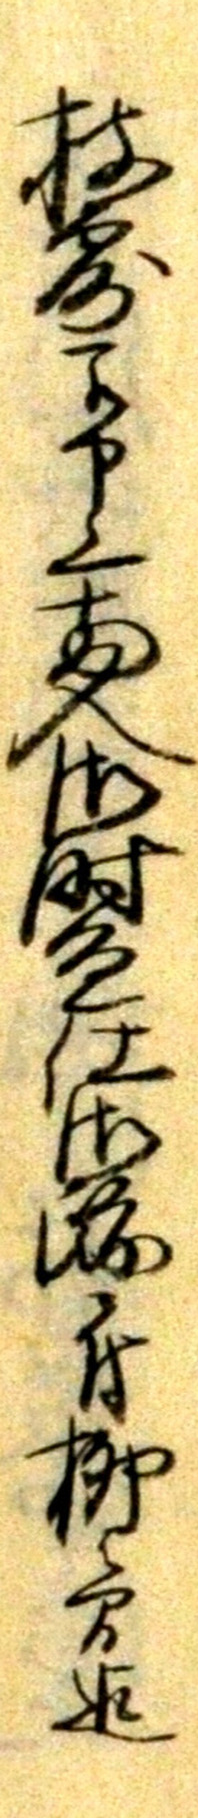披露被申上両人御時宜仕御跡ニ付柳之間迄
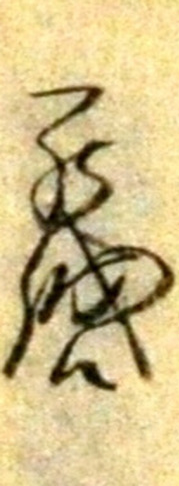罷越候
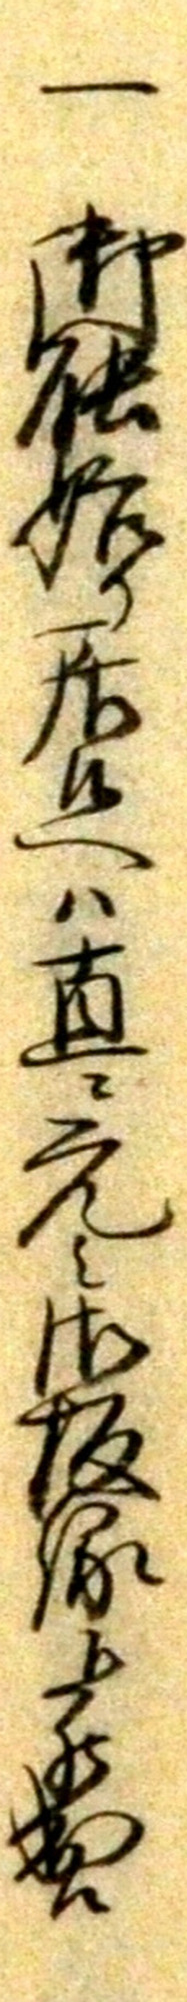一御能始り居候へハ直ニ元之御板縁え罷出候
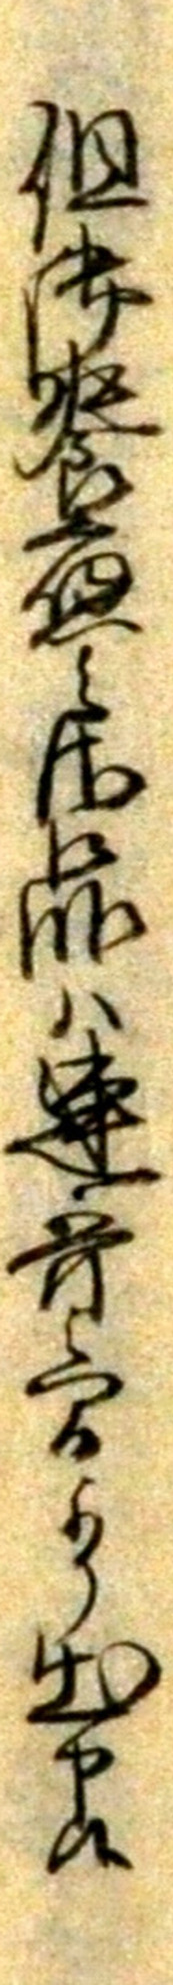但御饗応之御品ハ連哥之門より出申候
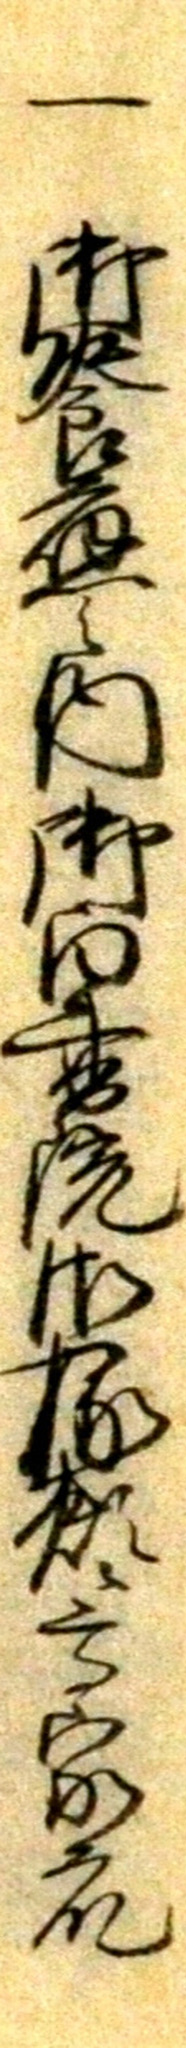一御饗応之内御白書院御縁頬ニ高家衆
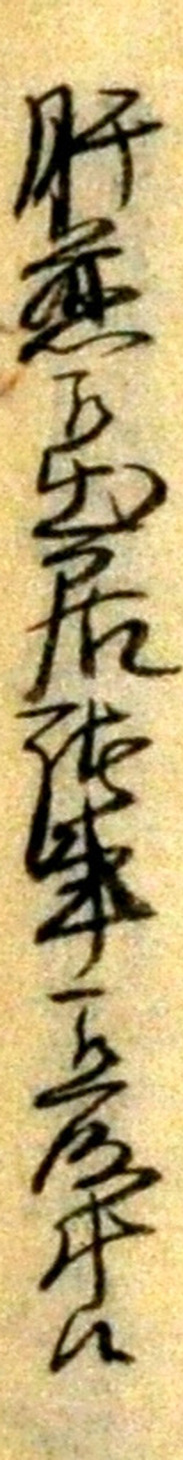肝煎被出居諸事被取計候
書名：御移徒相済御祝儀御能ノ節ノ留外
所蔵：伊那市立高遠町図書館・合同会社AMANE
